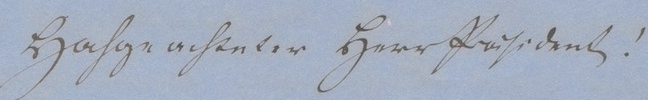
Hochgeachteter Herr Präsident!
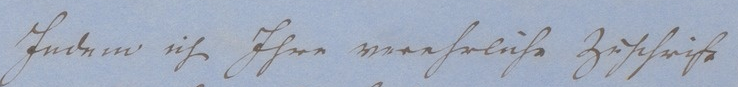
Indem ich Ihre verehrliche Zuschrift
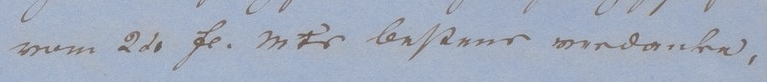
vom 24 fl. Mt's bestens verdanke,
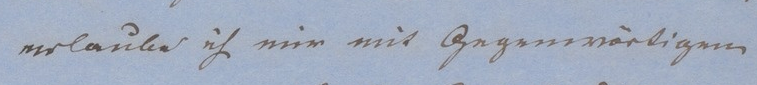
erlaube ich mir mit Gegenwärtigem
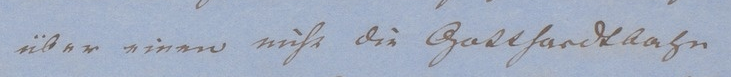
über einen nicht die Gotthardtbahn
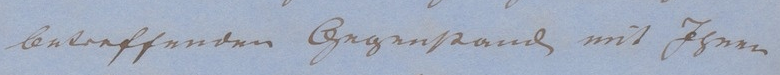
betreffenden Gegenstand mit Ihnen
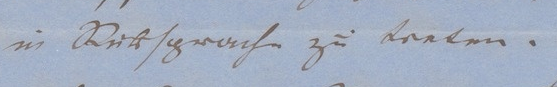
in Rüksprache zu treten.
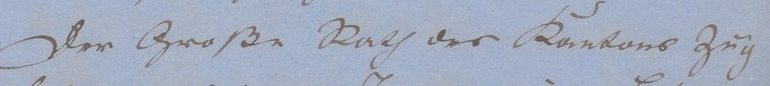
Der Große Rath des Kantons Zug
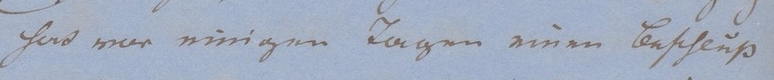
hat vor einigen Tagen einen Beschluß
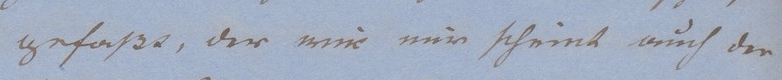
gefaßt, der wie mir scheint auch der
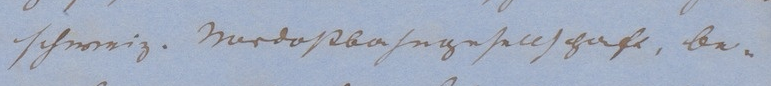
schweiz. Nordostbahngesellschaft, be-
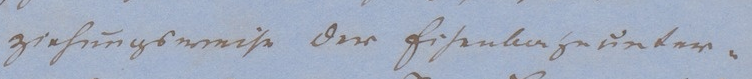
ziehungsweise der Eisenbahnunter-
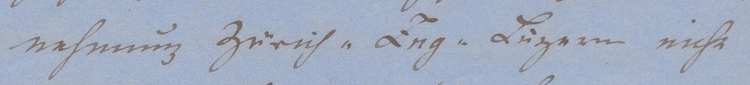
nehmung Zürich – Zug – Luzern nicht
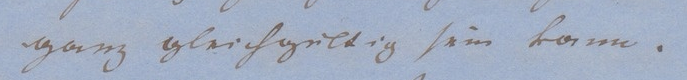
ganz gleichgültig sein kann.
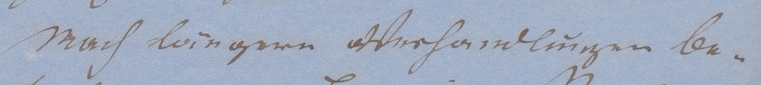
Nach längeren Verhandlungen be-
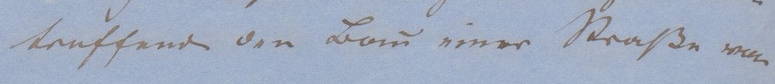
treffend den Bau einer Straße von
